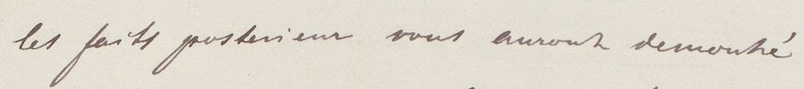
les faits posterieur vous auront demontré
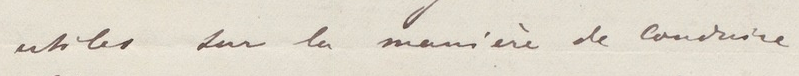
utiles sur la manière de conduire
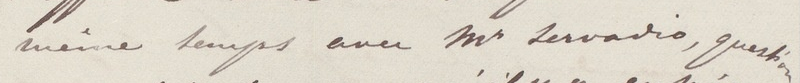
même temps avec MrServadio, question
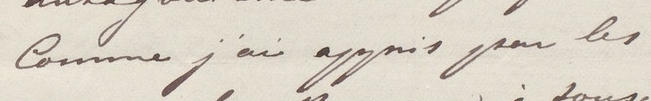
Comme j'ai appris par les
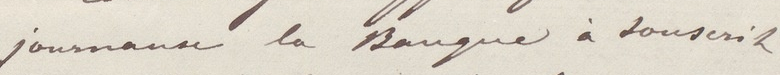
journaux la Banque à souscrit
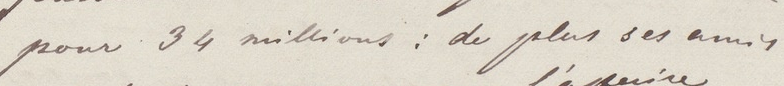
pour 34 millions: de plus ses amis
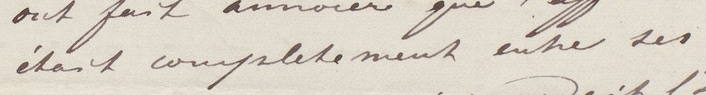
était completement entre ses
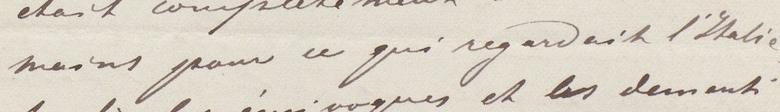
mains pour ce qui regardait l'Italie.
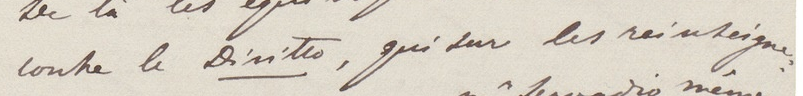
contre le Diritto, qui sur les reinseigne-
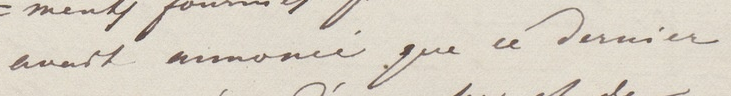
avait annoncé que ce dernier
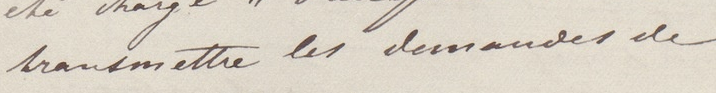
transmettre les demandes de
